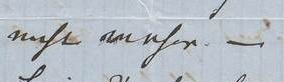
nicht mehr. –
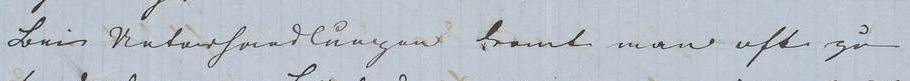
Bei Unterhandlungen komt man oft zu
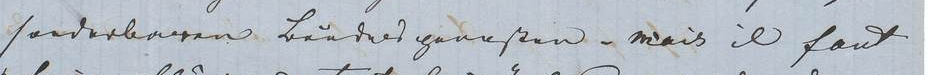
sonderbaren Bundesgenoßen – Mais il faut
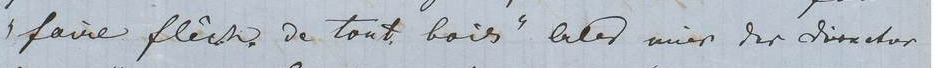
«faire flêch de tout bois». Als mir der Director
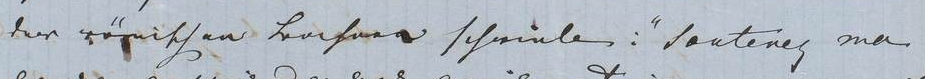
der römischen Bahnen schrieb: «Soutenez ma
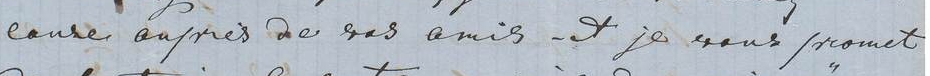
cause auprès de vos amis – et je vous promet
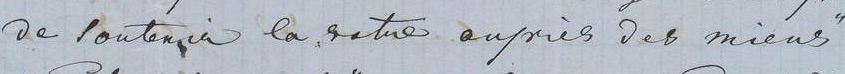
de soutenir la votre auprès des miens»
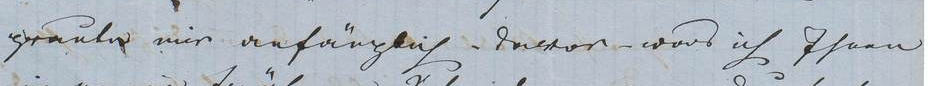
graute mir anfänglich – davor – was ich Ihnen
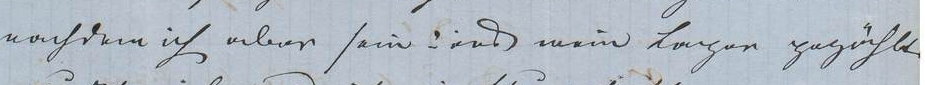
nachdem ich aber sein – und mein Lager gezählt
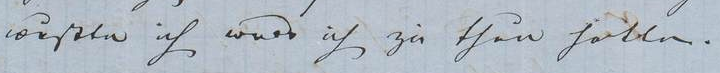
wußte ich was ich zu thun hatte.
